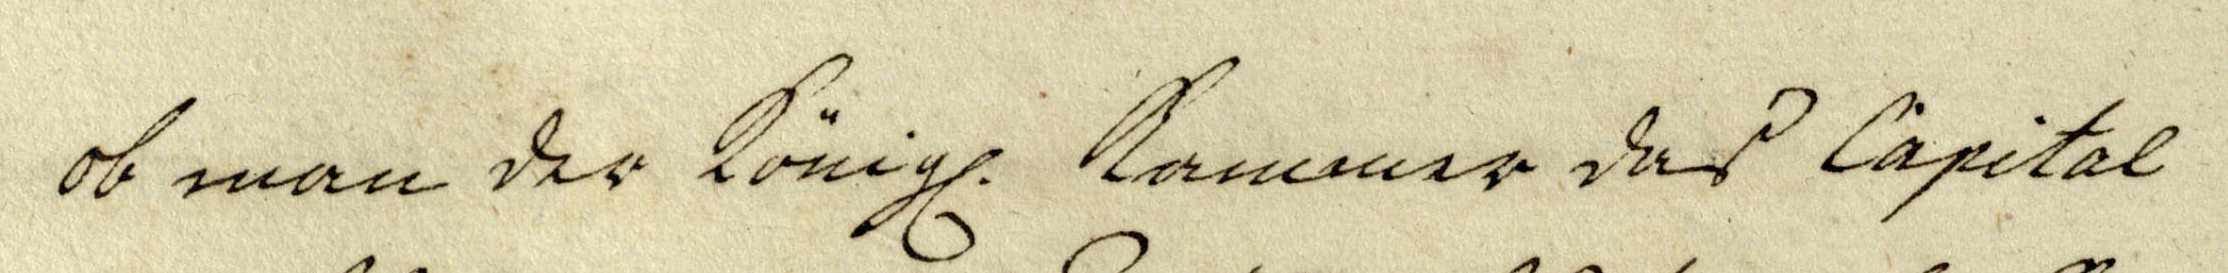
ob man der Königl. Kammer das Capital
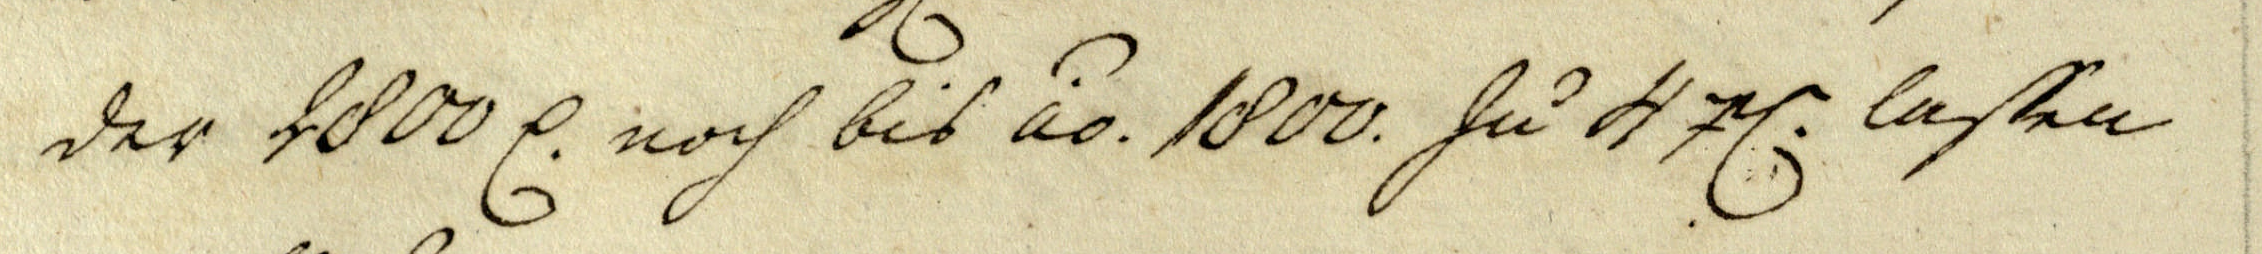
der 2800 l. noch bis ao. 1800. zu 4 pl. lassen
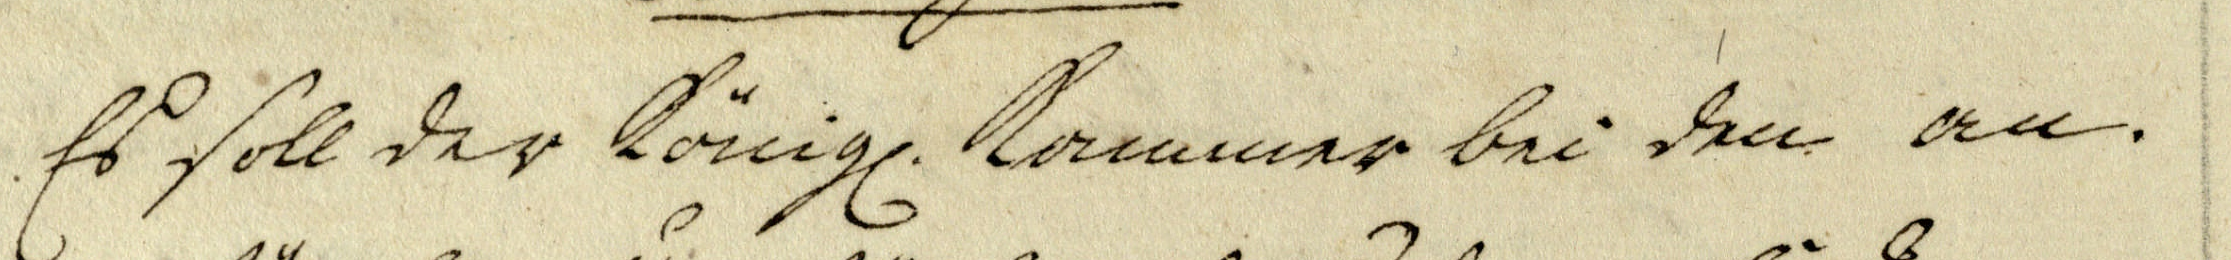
Es soll der Königl. Kammer bei den an¬
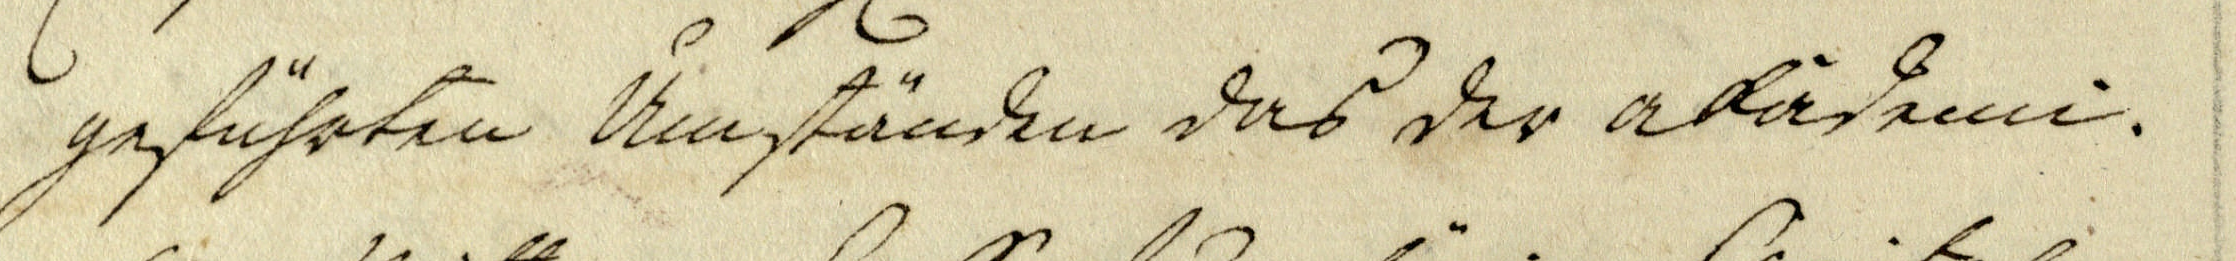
geführten Umständen das der akademi¬
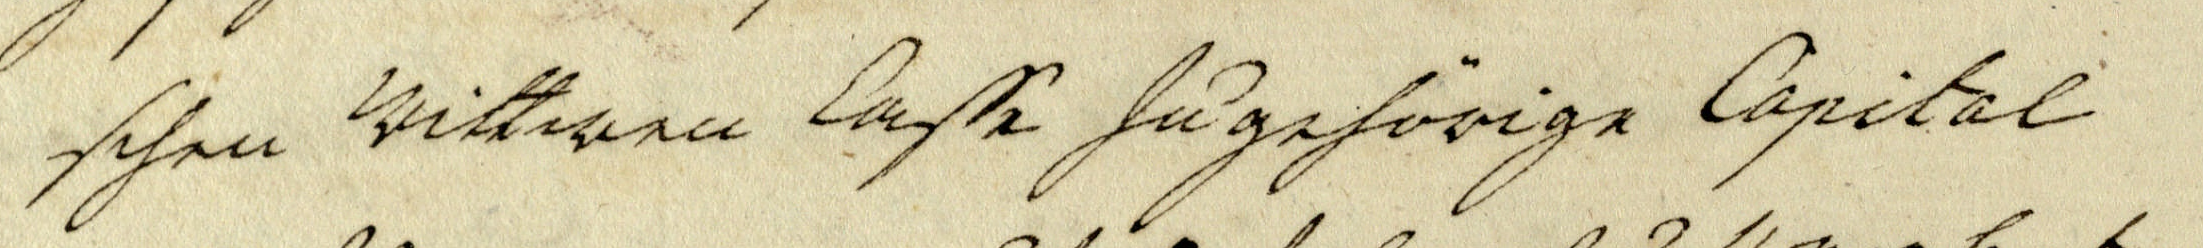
schen Wittwen Casse zugehörige Capital
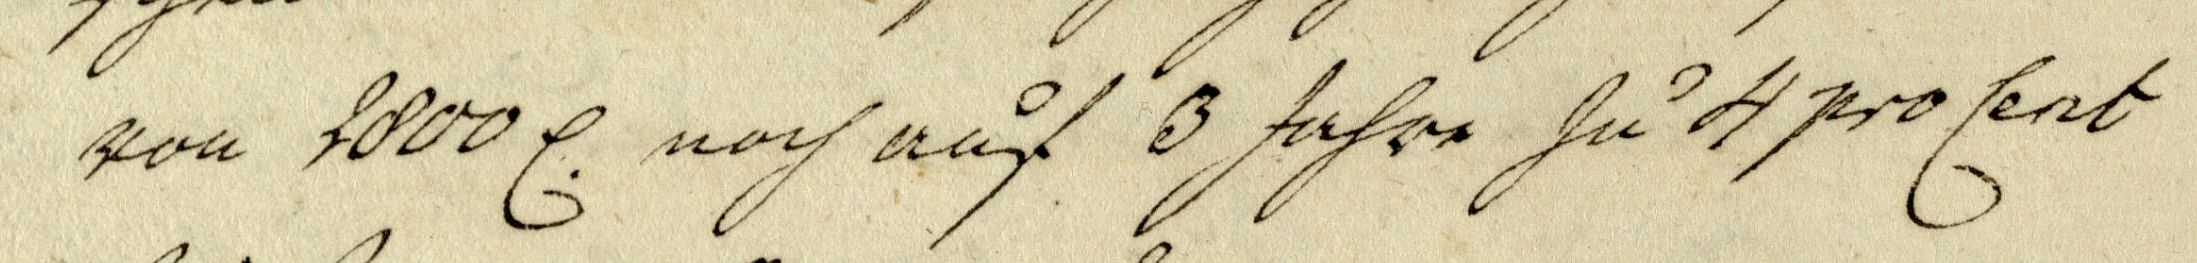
von 2800 l., noch auf 3 Jahre zu 4 pro Cent
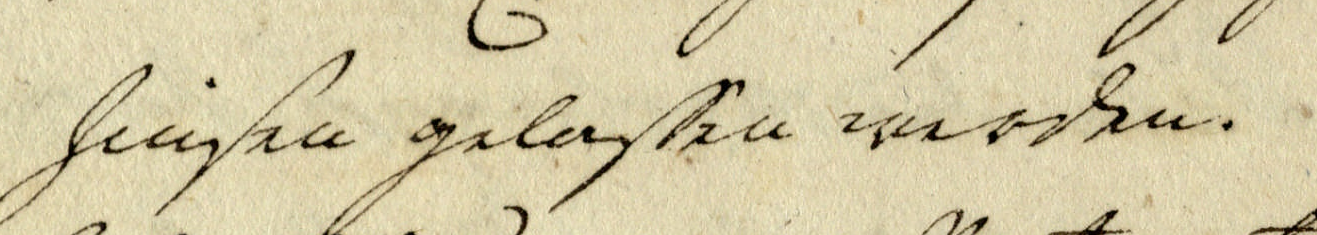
Zinsen gelassen werden.
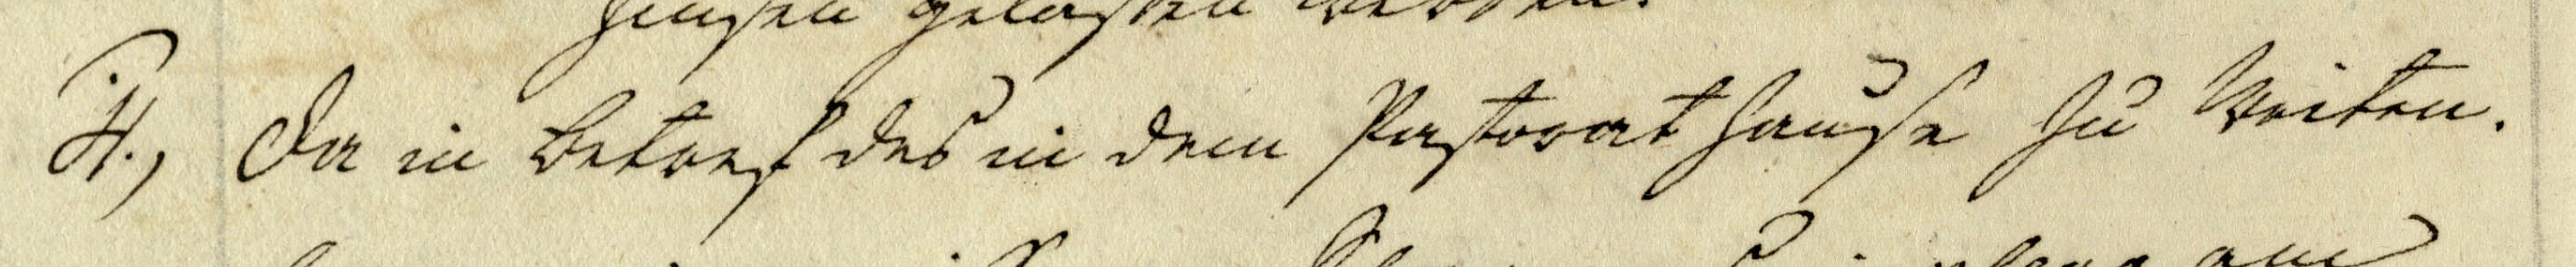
4., Da in Betref des in dem Pastorathause zu Weiten¬
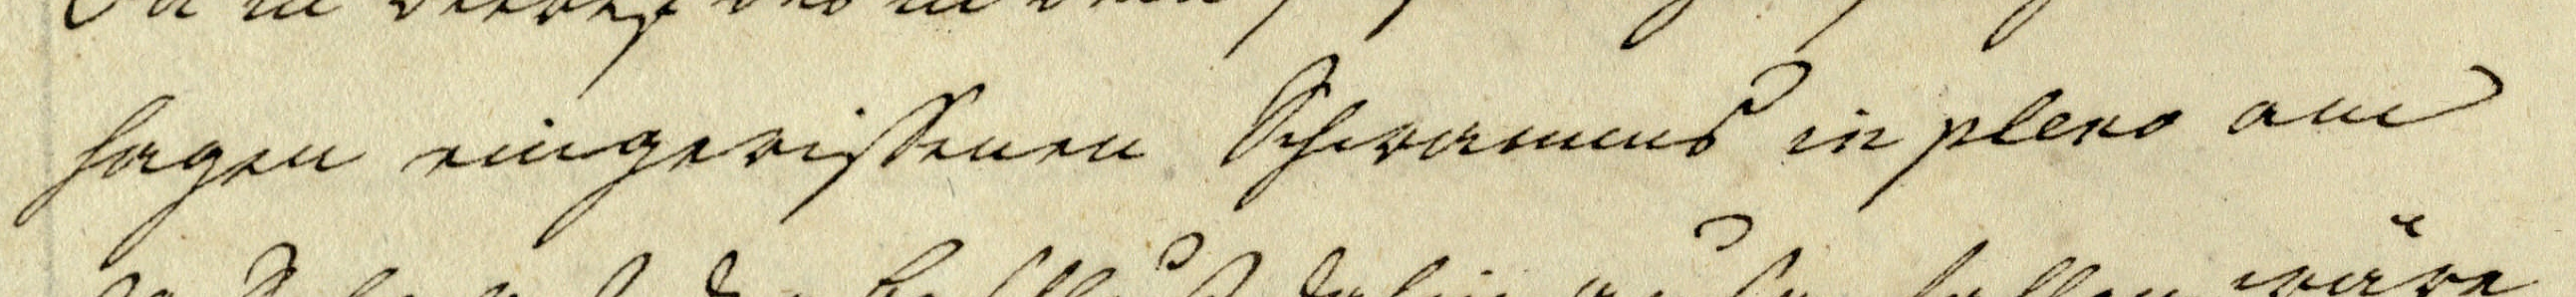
hagen eingerissenen Schwamms in pleno am
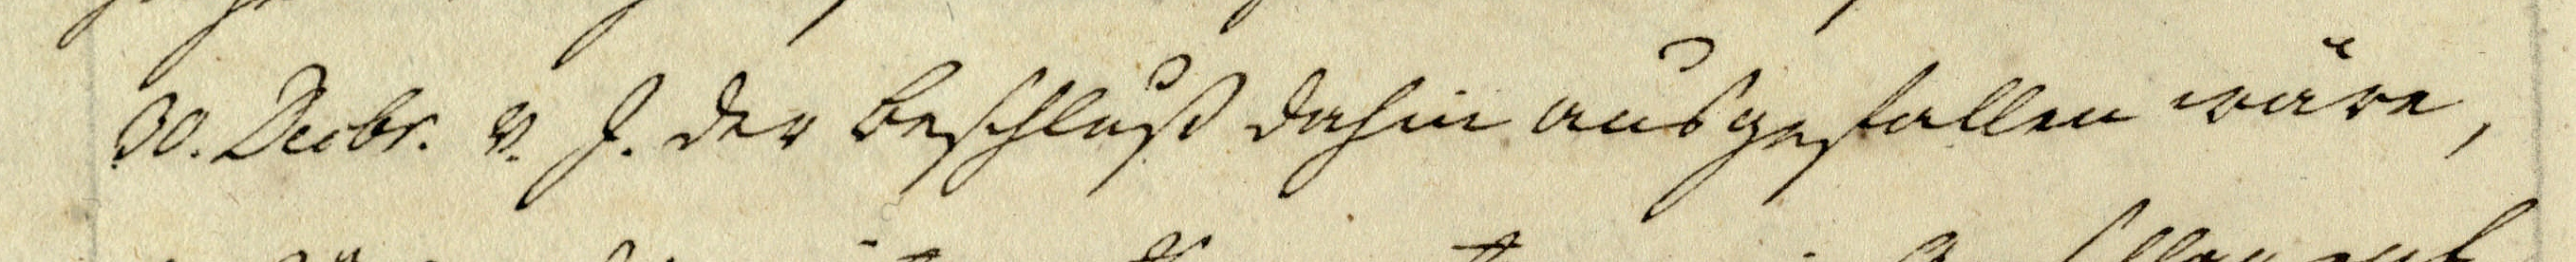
30. Decbr. v. J. der Beschluß dahin ausgefallen wäre,
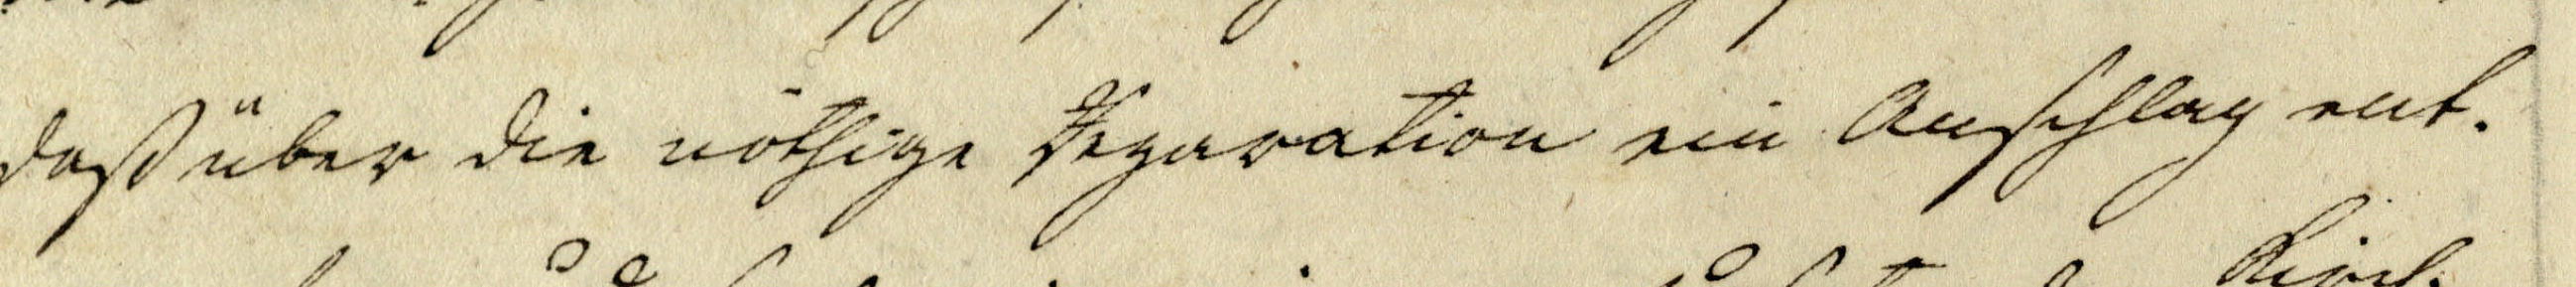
daß über die nöthige Reparation ein Anschlag ent¬
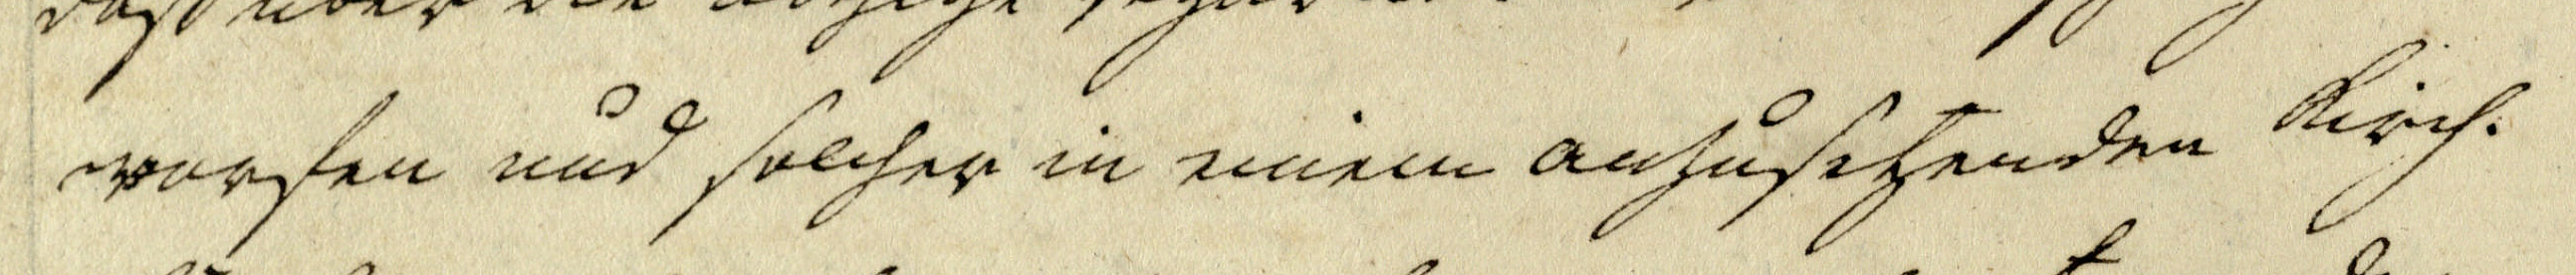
worfen und solcher in einem anzusetzenden Kirch¬
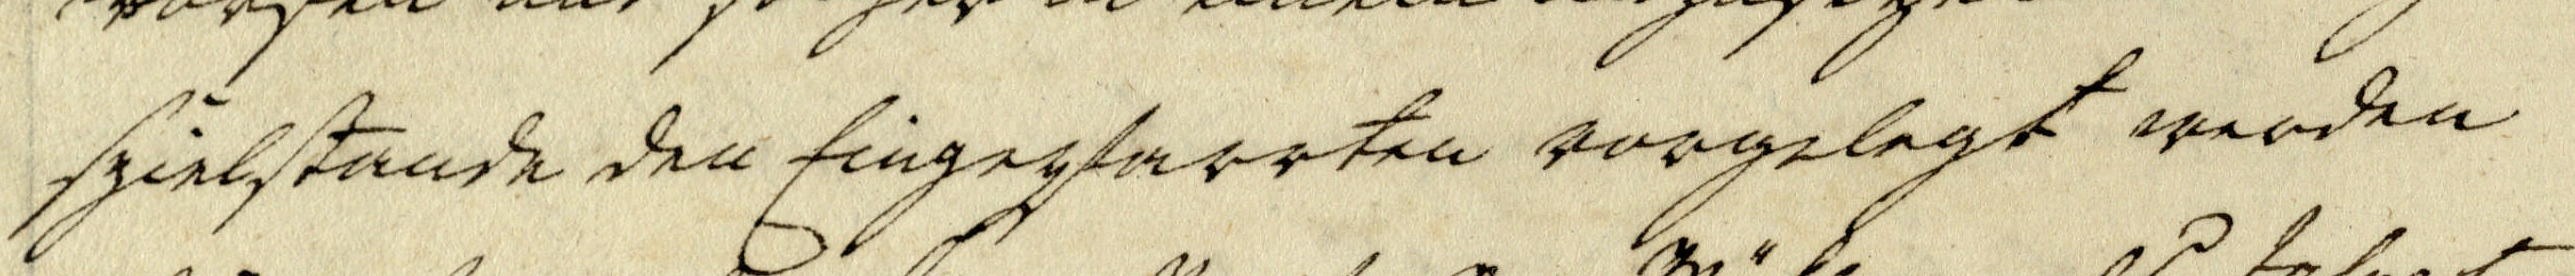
spielstande den Eingepfarrten vorgelegt werden
